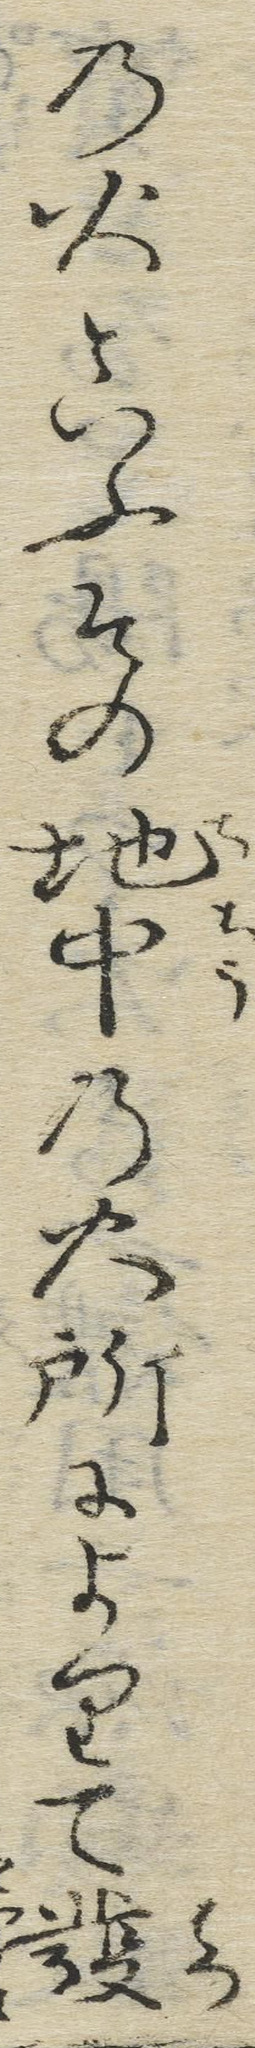の火といふその地中の火所によりて発
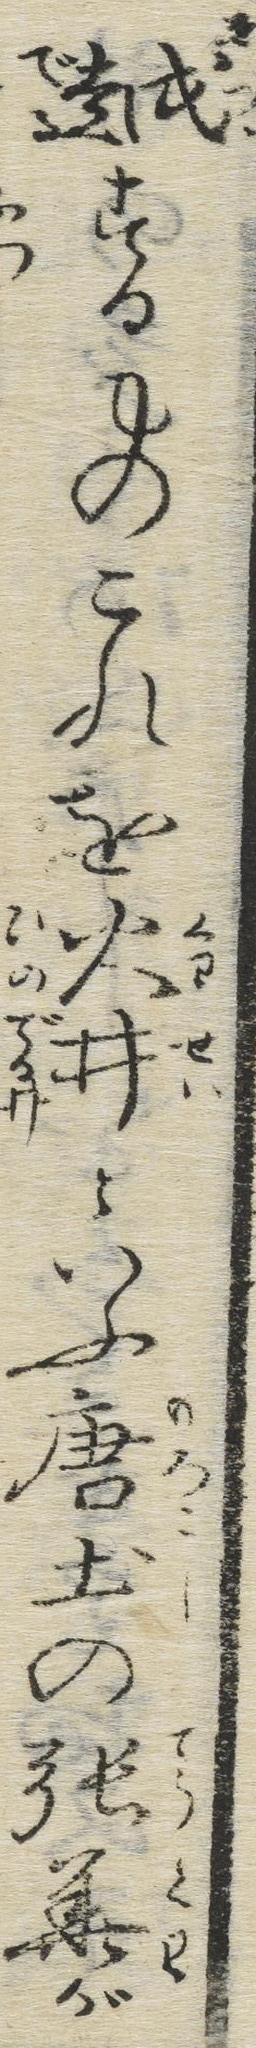越するものこれを火井といふ唐土の張華が
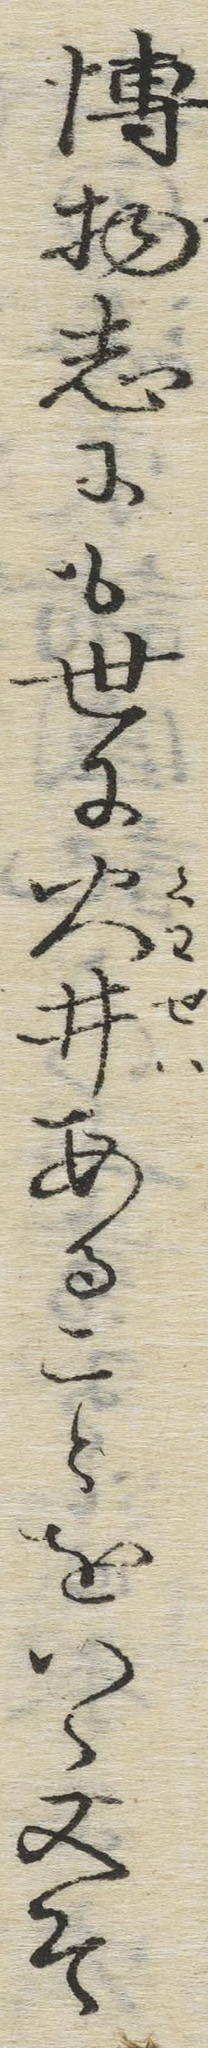博物志にも世に火井あることをいゝ又そ
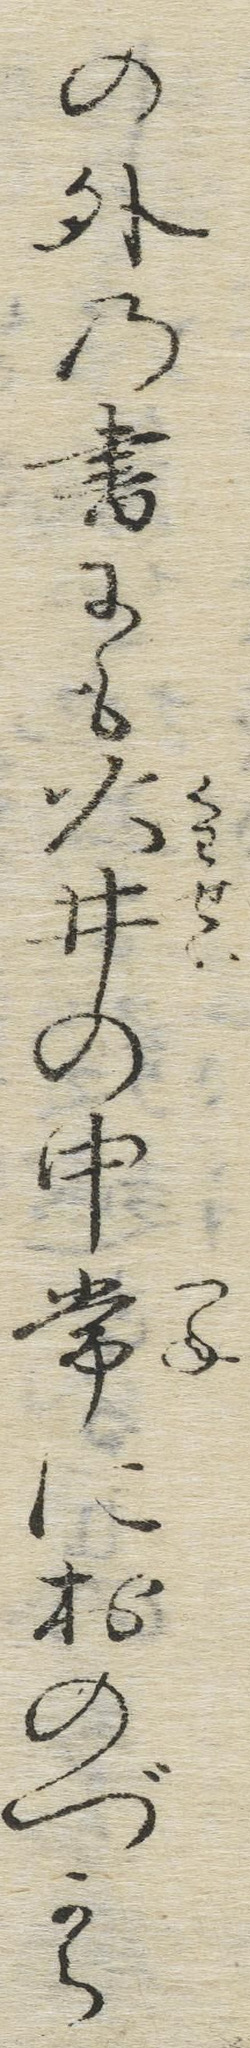の外の書にも火井の中常におのづから
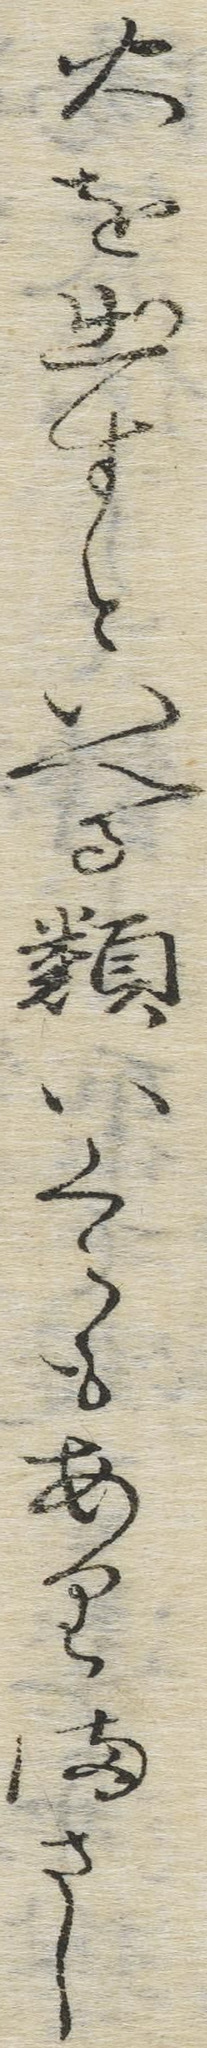火を出すといへる類いくらもありまさし
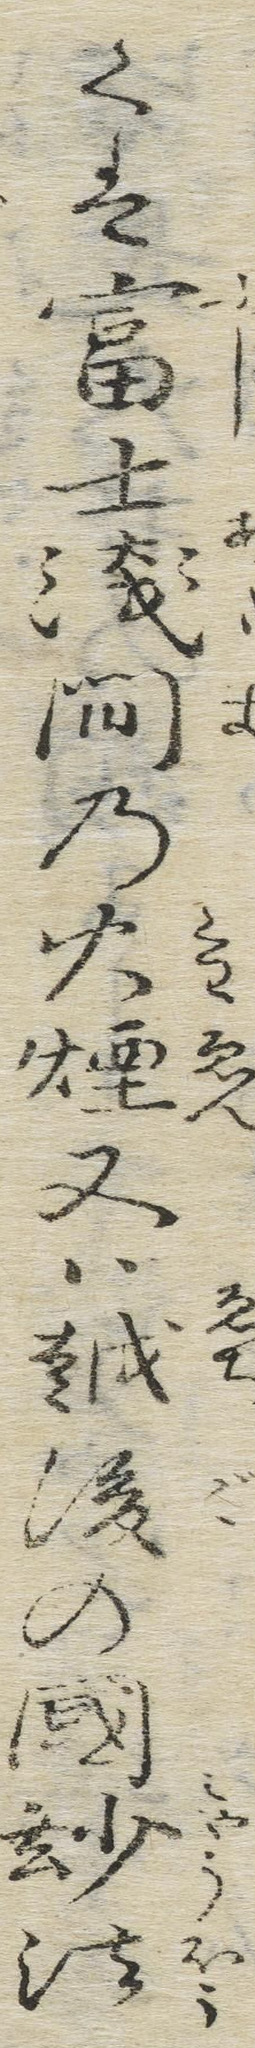くは富士浅間の火煙又は越後の国玅法
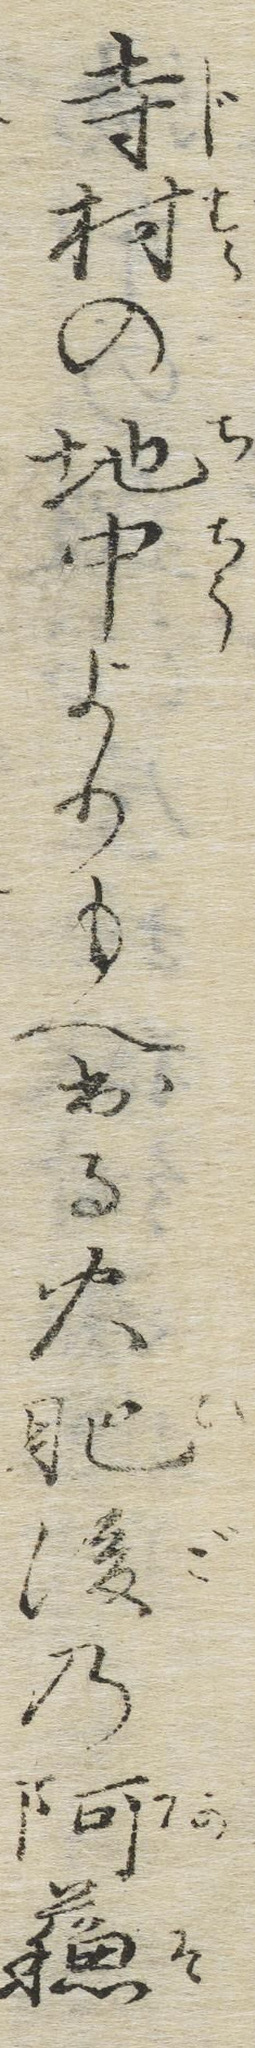寺村の地中よりもへ出る火肥後の阿蘇
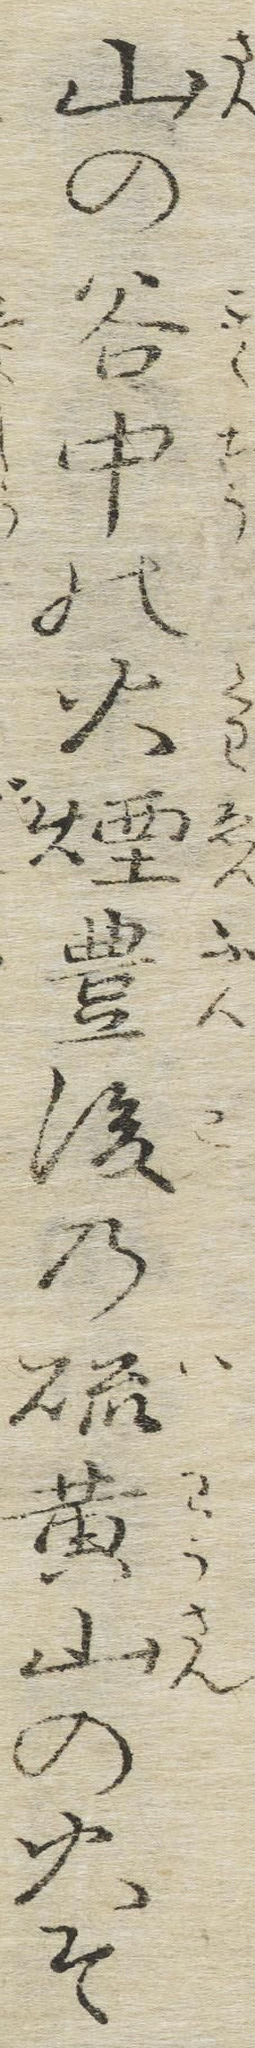山の谷中の火煙豊後の硫黄山の火そ
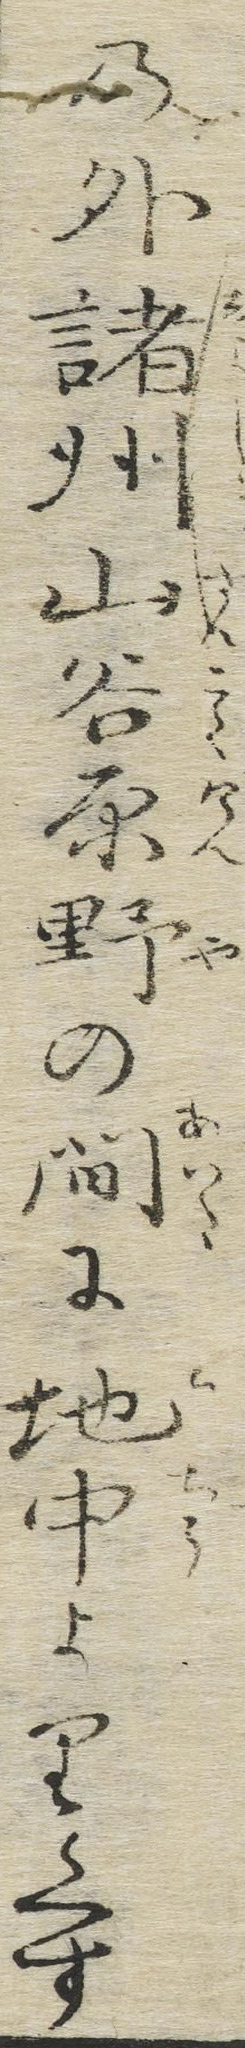の外諸州山谷原野の間に地中よりくす

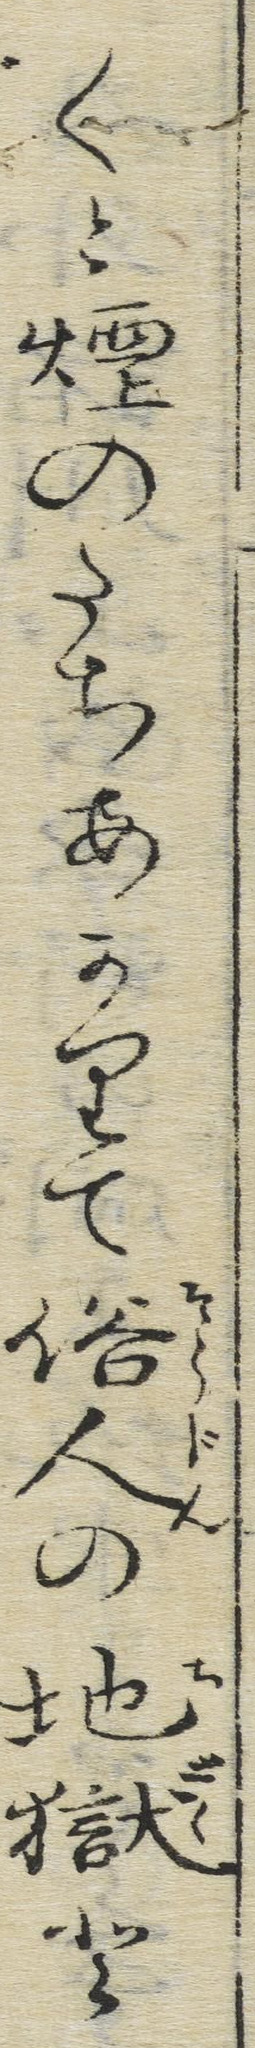くと煙のたちあかりて俗人の地獄と
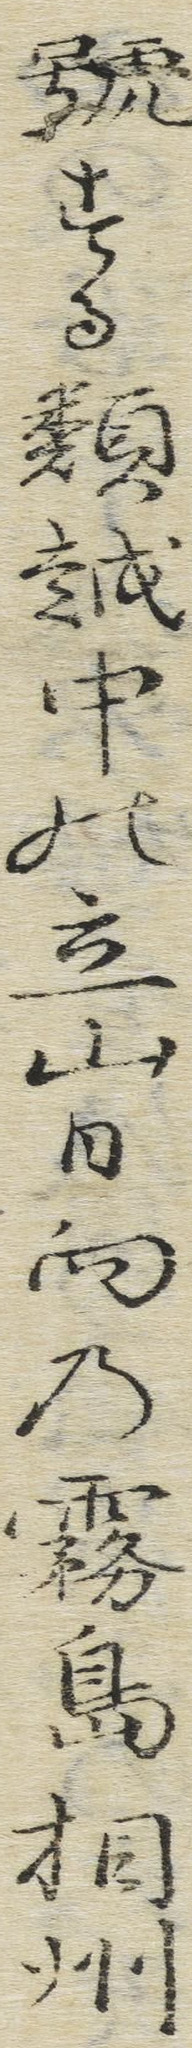号する類越中の立山日向の霧島相州
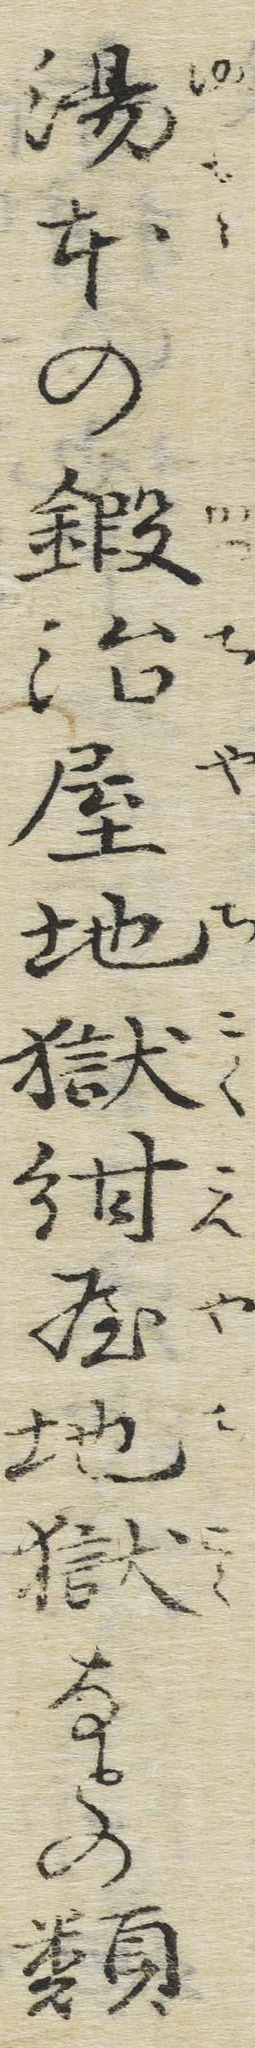湯本の鍛冶屋地獄紺屋地獄なとの類
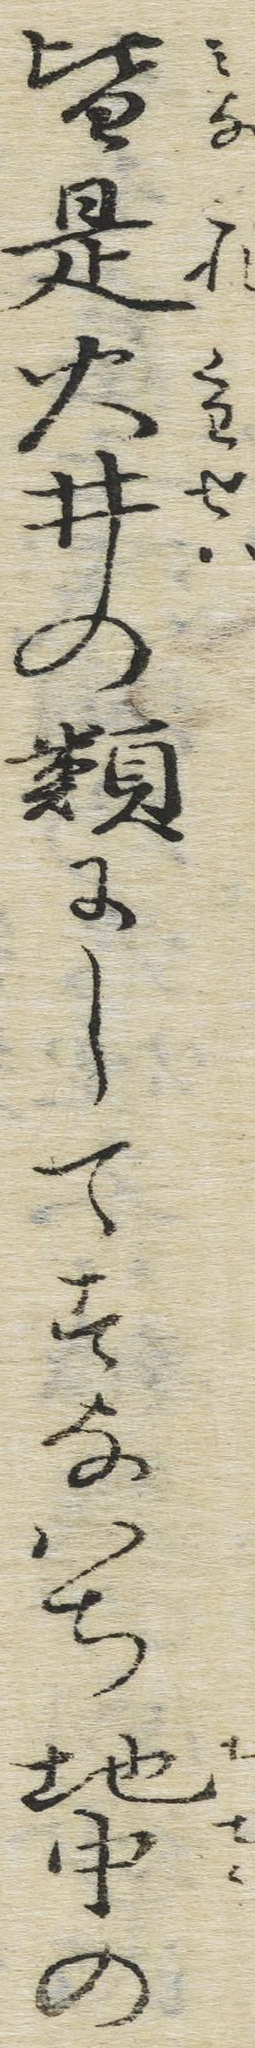皆是火井の類にしてすなはち地中の
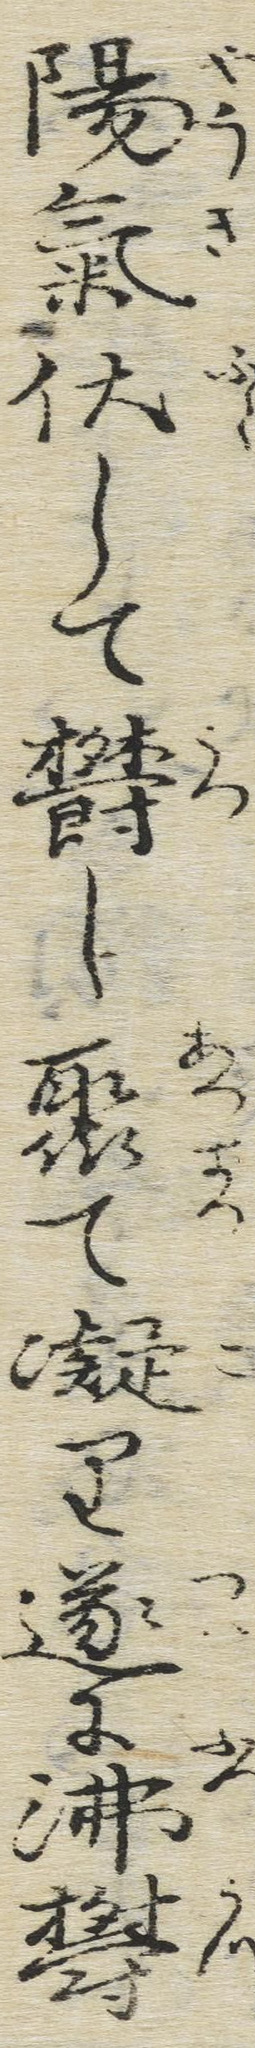陽気伏して欝し聚て凝り遂に沸欝
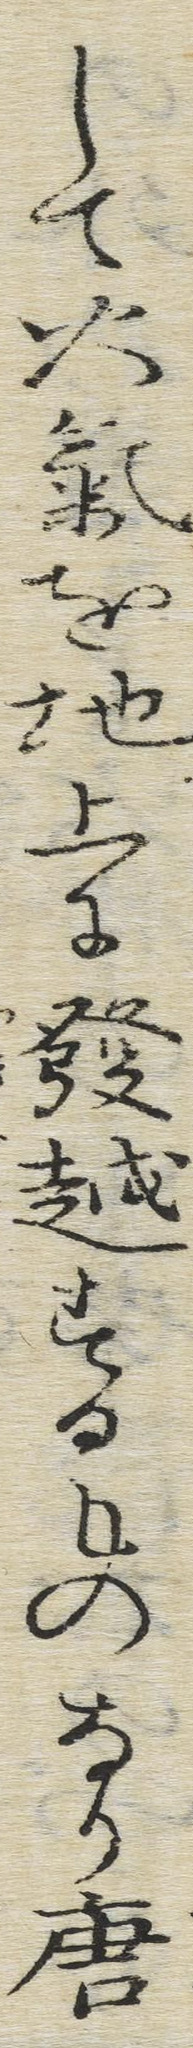して火気を地上に発越するものなり唐
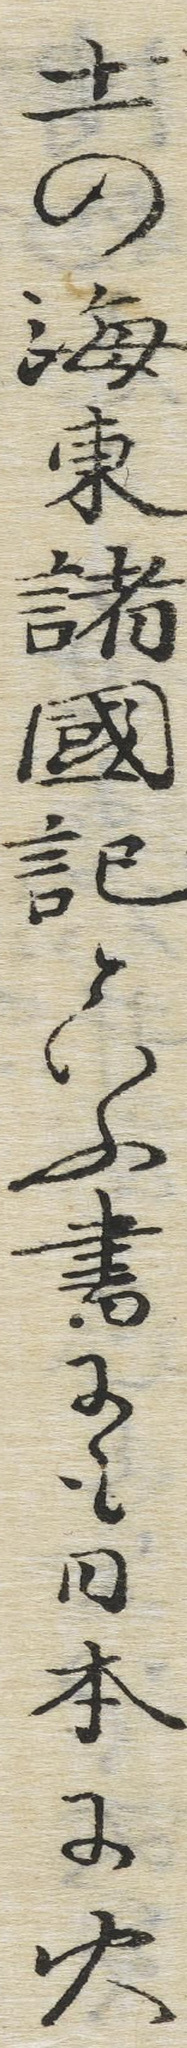土の海東諸国記といふ書にも日本に火
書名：温泉考
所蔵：東京大学地震研究所図書室 Earthquake Research Institute Library, The University of Tokyo, JAPAN
